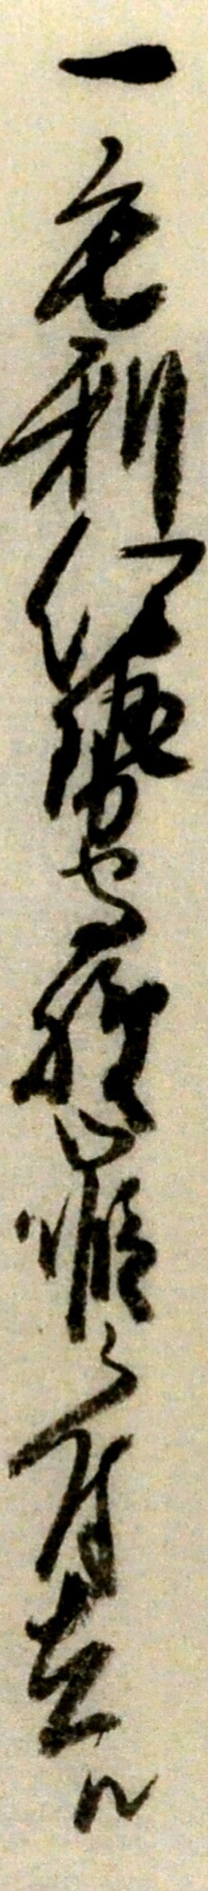一毛利伊勢守様御暇に付去ル
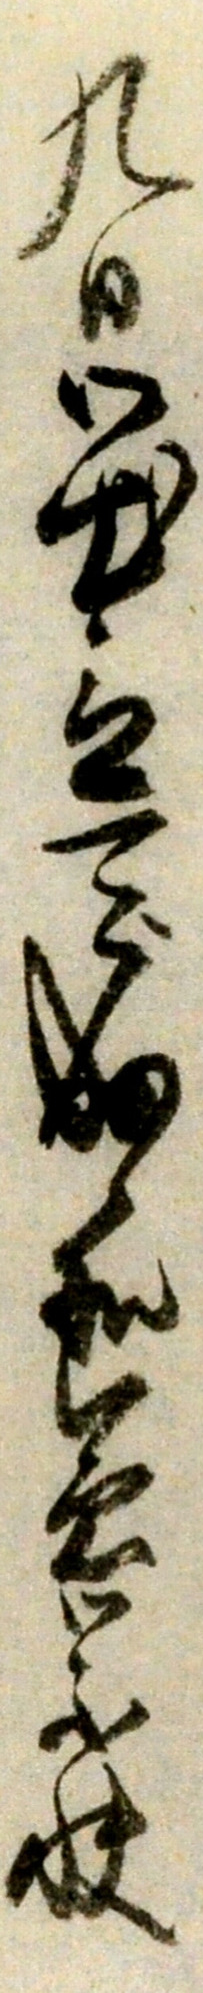九日御出立可被成候処急御不快
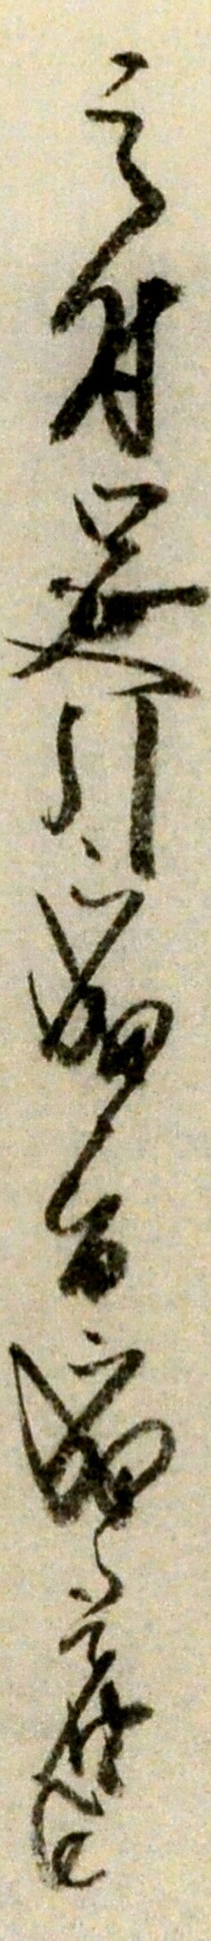に付御延引被成候旨被成御届候由
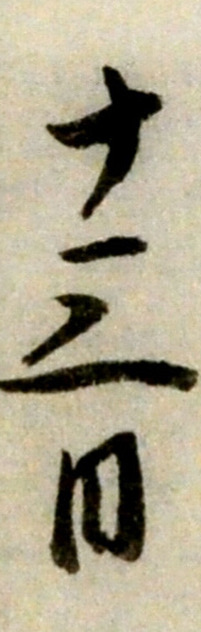十三日
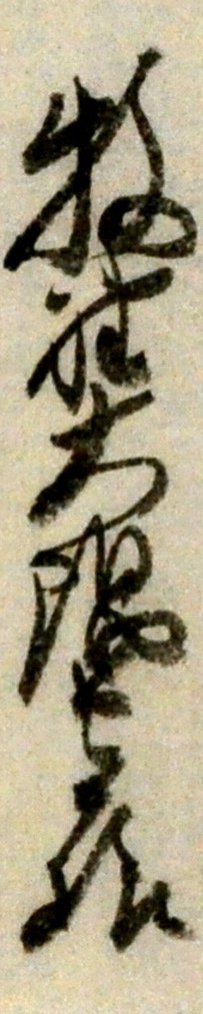牧野大隅守様
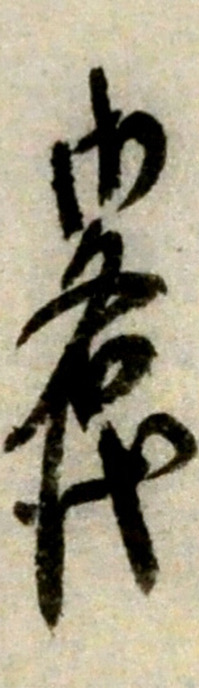御名代
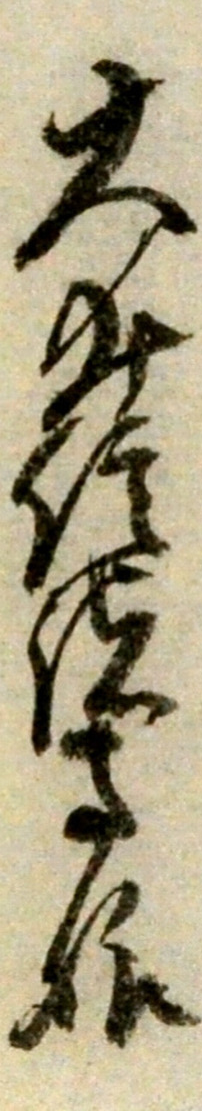大井信濃守様
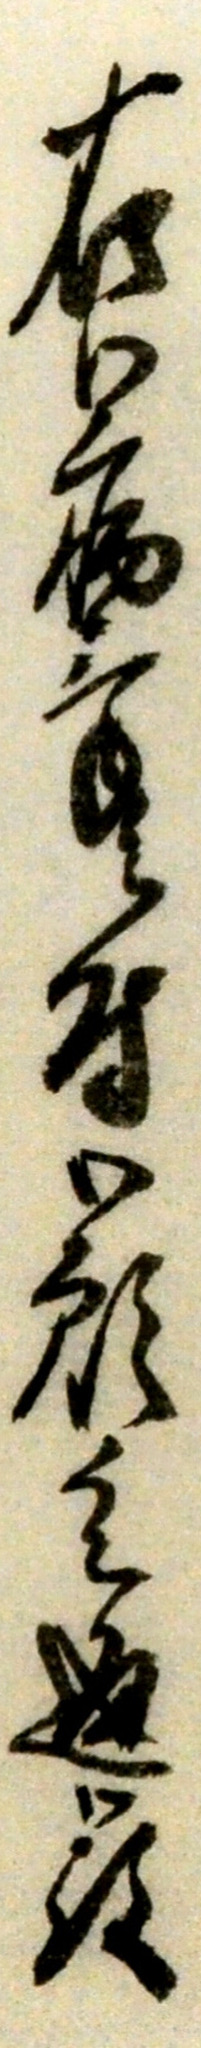右御病気に付御願之通御役
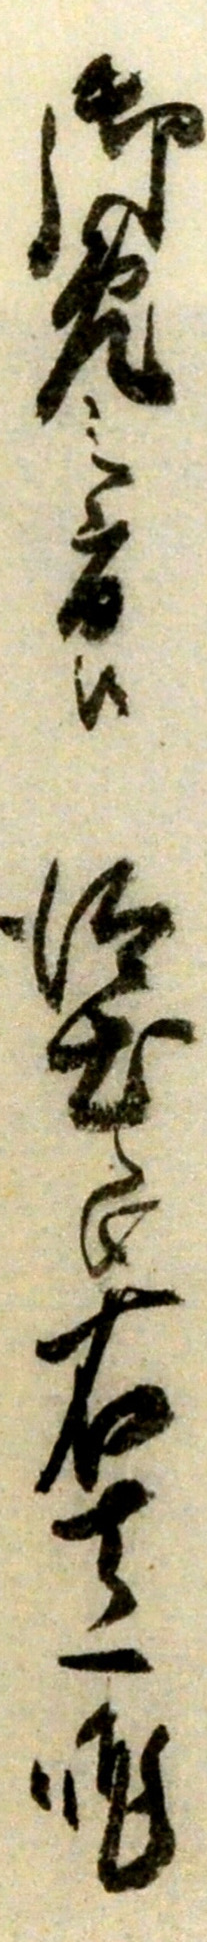御免之旨被仰出候由右は一昨
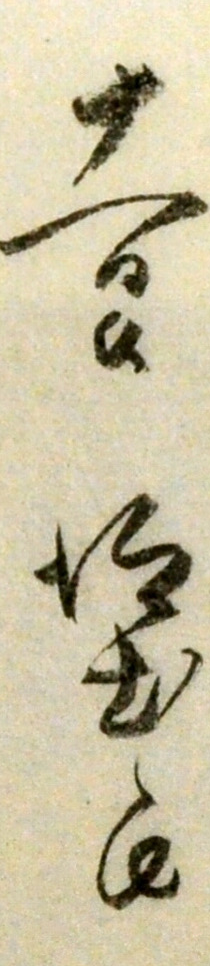十一日被仰出候由
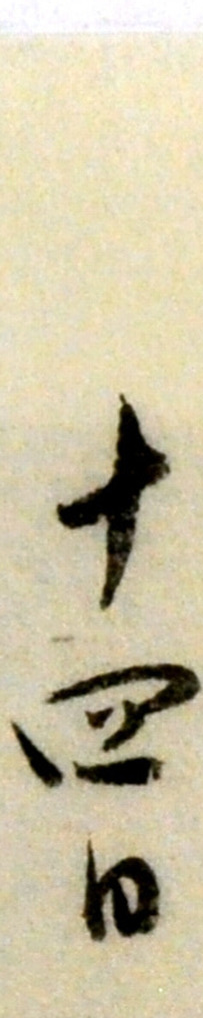十一日
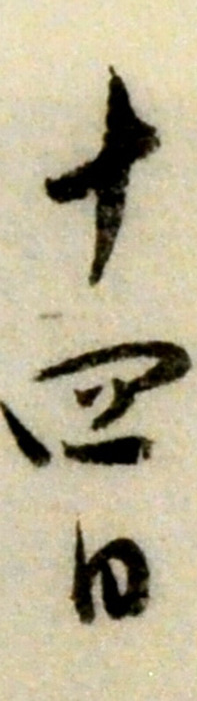十一日

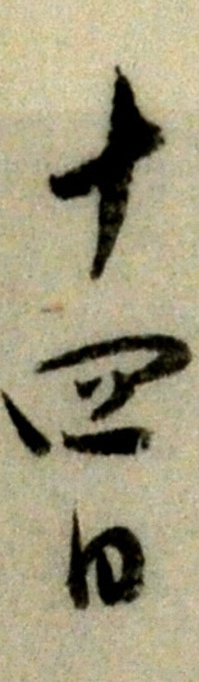十四日
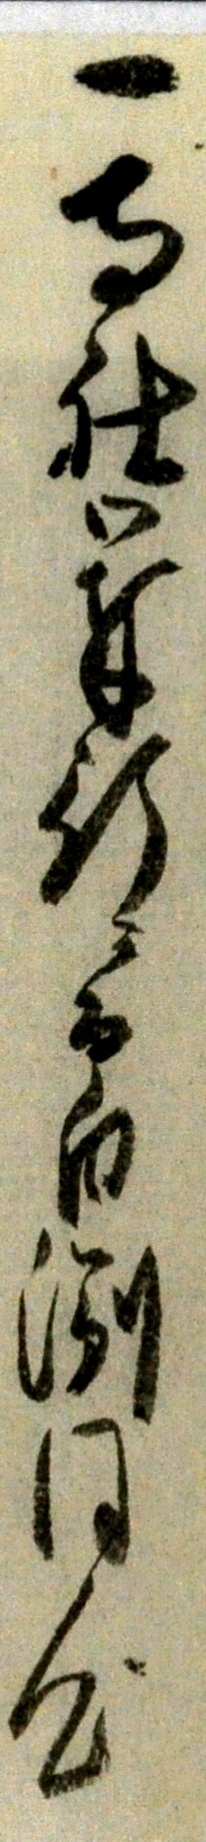一寺社御奉行にて白洲同心
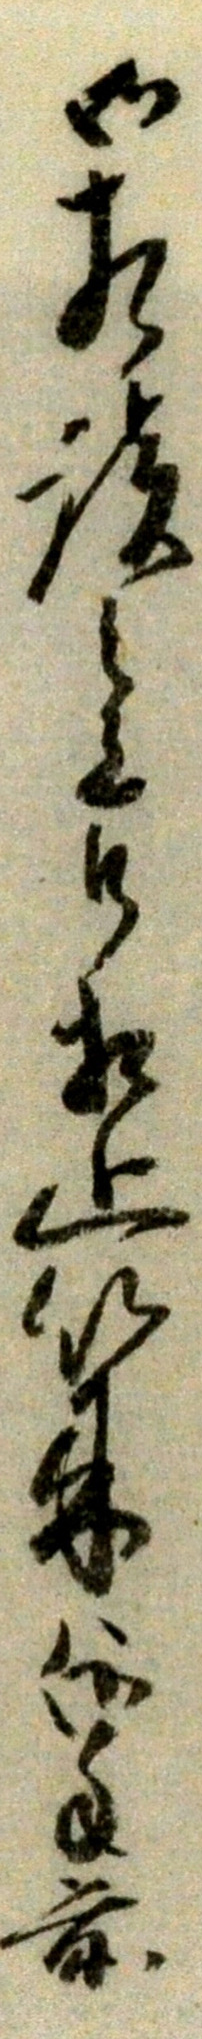御相談之上被相止依頼は御手前
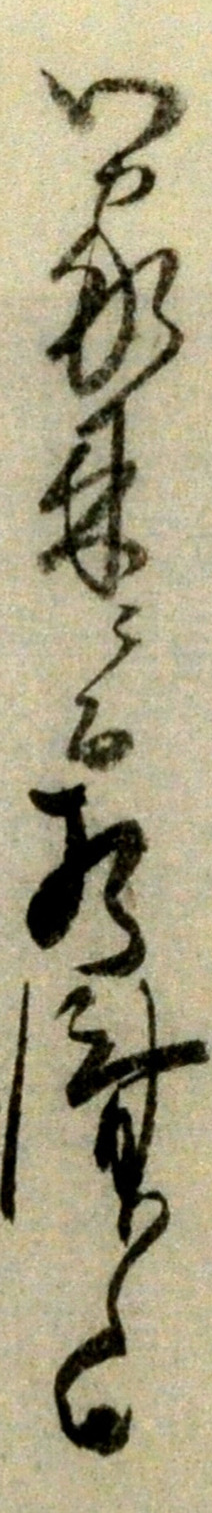御家来にて相済候由
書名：申合帳〔一括〕
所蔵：伊那市立高遠町図書館・合同会社AMANE
